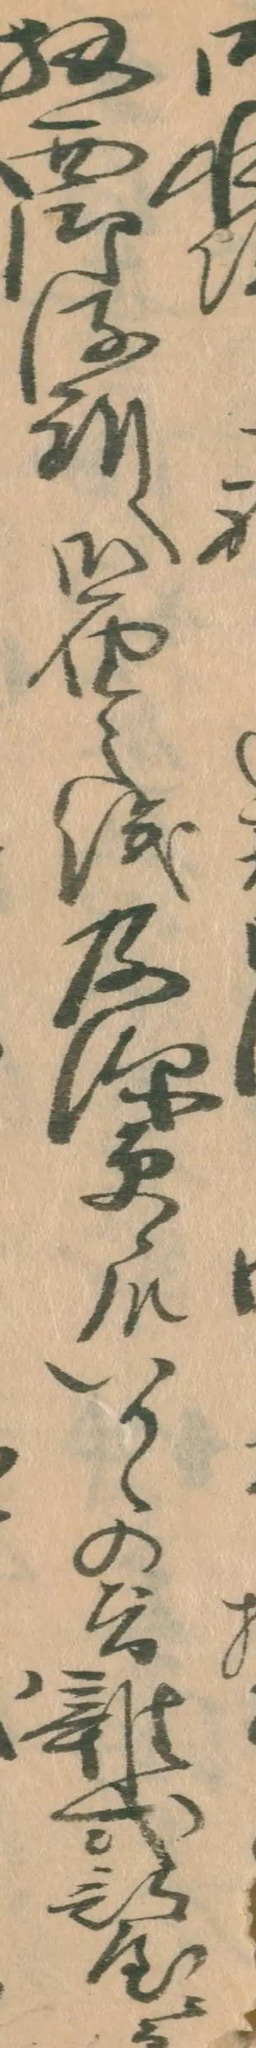扨西御役所へ御届之儀及深更候故いかゝの旨雑式部屋ニ而
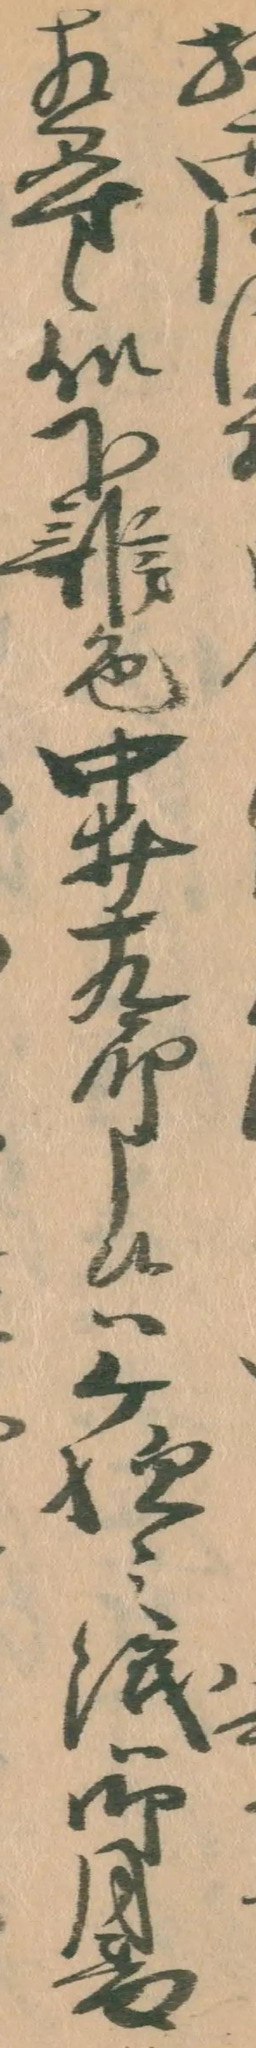相尋候処下雑色中井十九郎申候ハケ様之儀は御月番
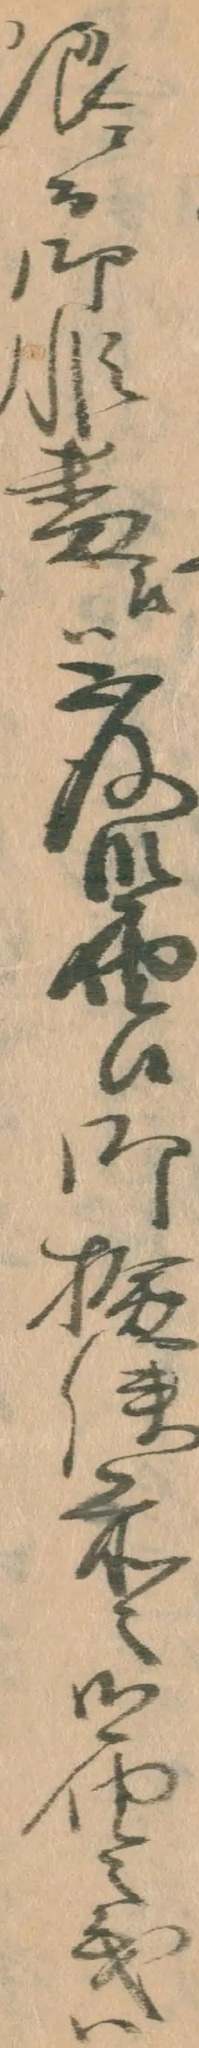限ニ而御非番江ハ不及御届候御検使前之御届之義ハ
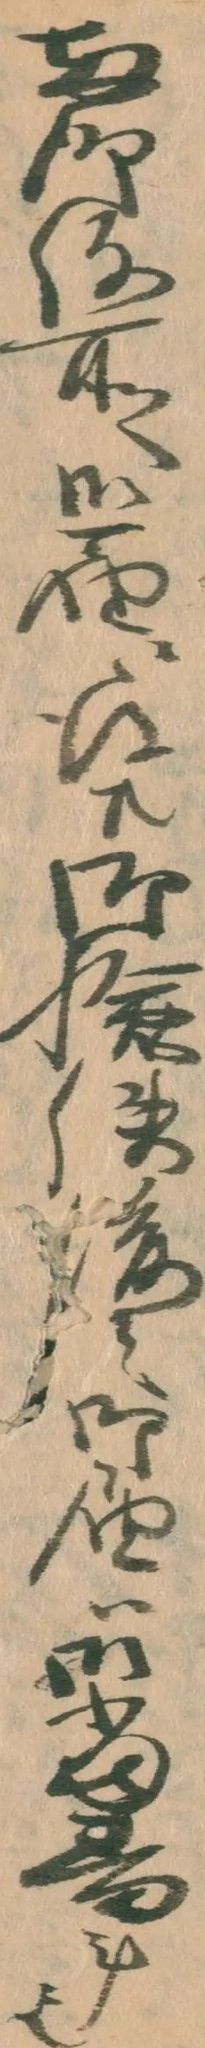両御役所へ御届ニ候得共御検使後之御届ハ御当番計ニて
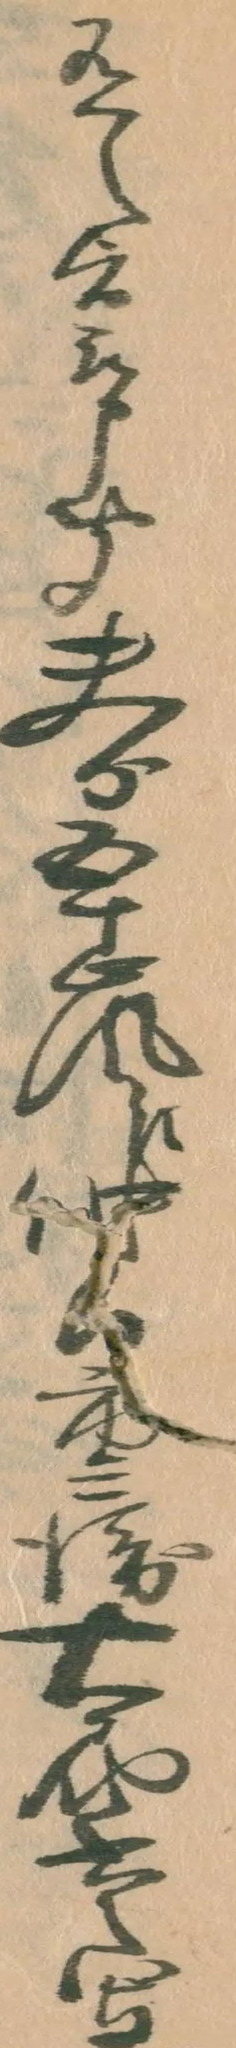有之旨被申聞夫ゟ五十嵐江仲間市兵衛右届書之写
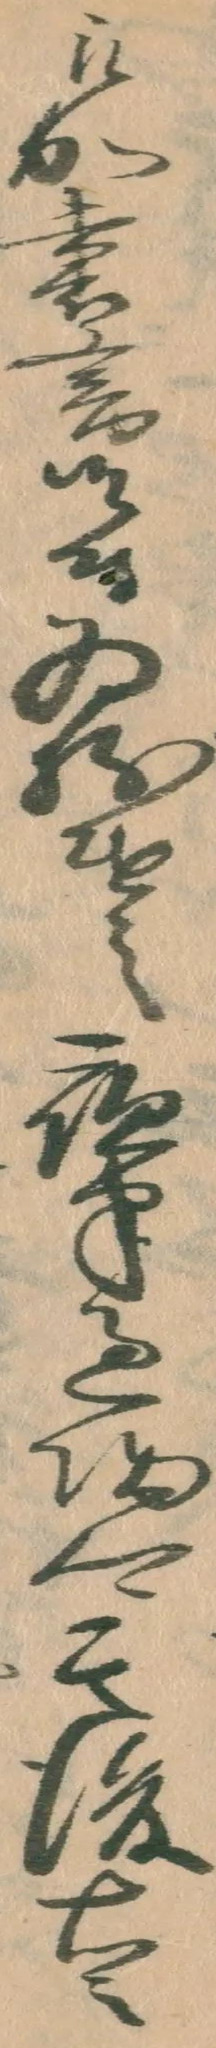被加裏書候ニ付為持遣之夜半過帰郷其後右之
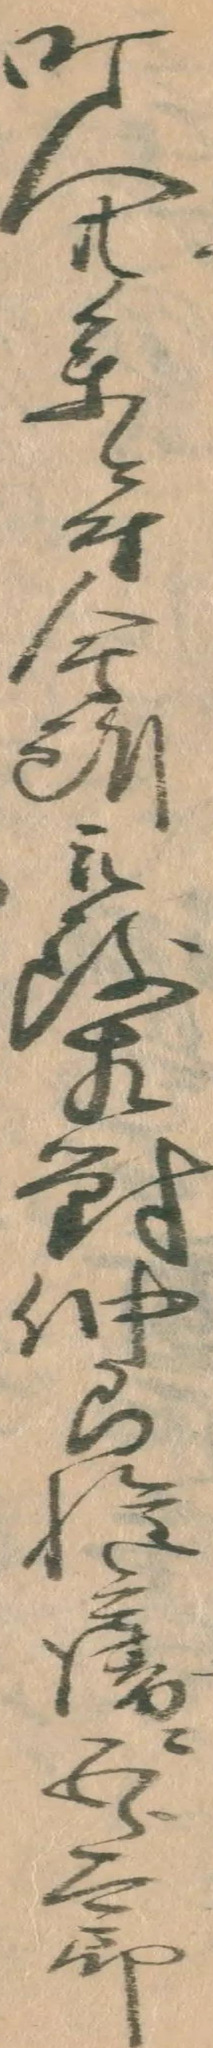町人共参ニ付会所被致相対仲間権兵衛ニ五郎太郎
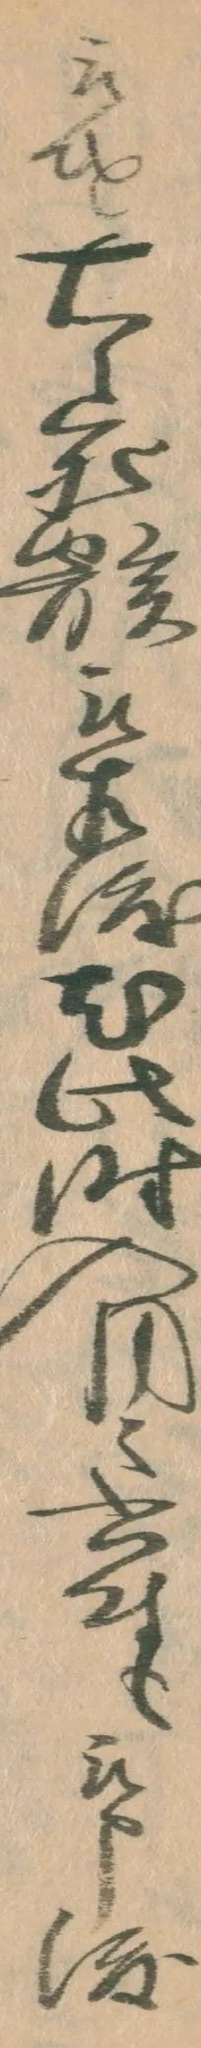被遣候右之死骸被相渡尤此時入用之書付も被申渡
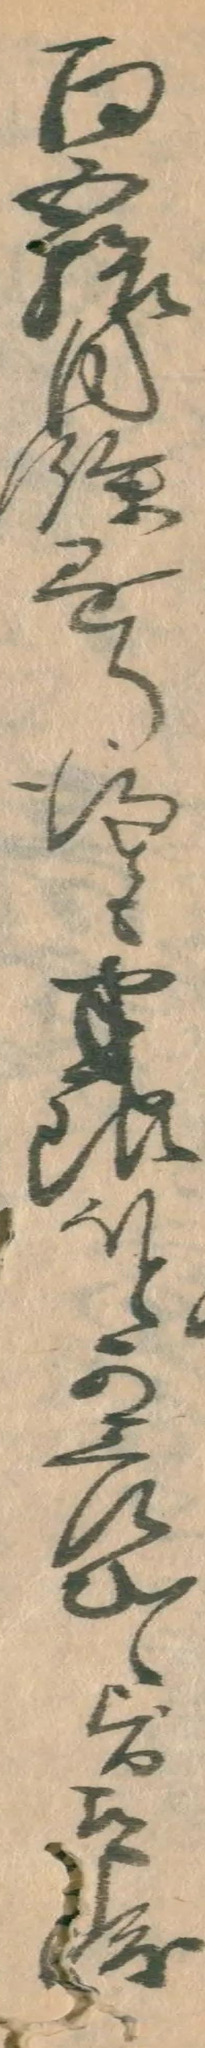百五拾目餘懸り候得とも半銀ほと可差出候旨被申渡
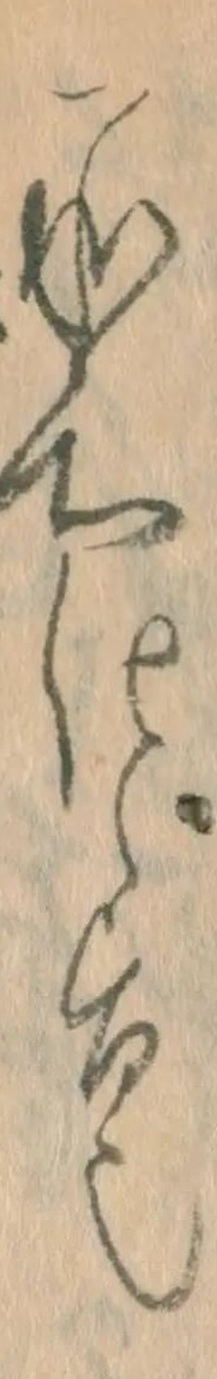承知仕候旨也
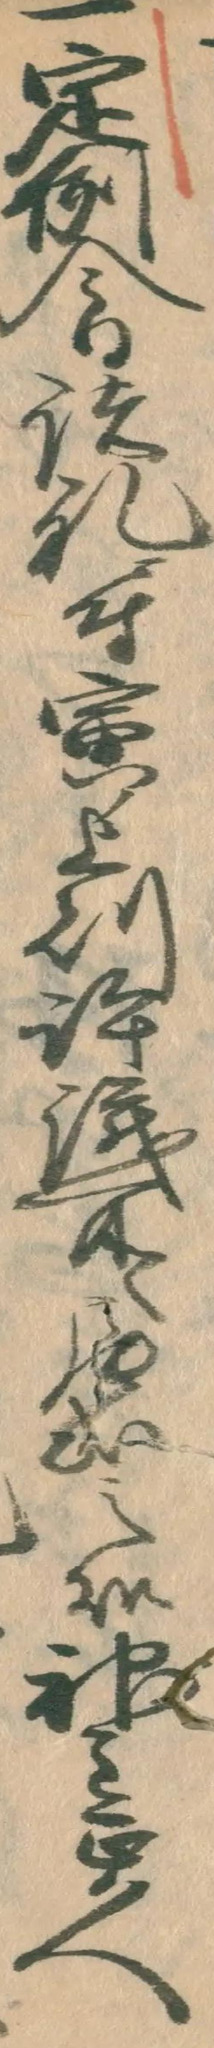一定例今日諸礼ニ付寅ノ上刻評議所へ罷出之処神主正久
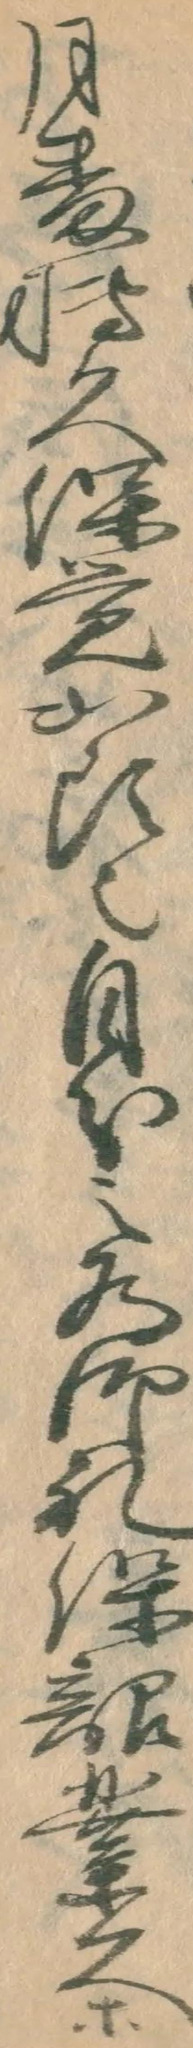月番博久保覚出頭也自分之為御礼保韶業久等
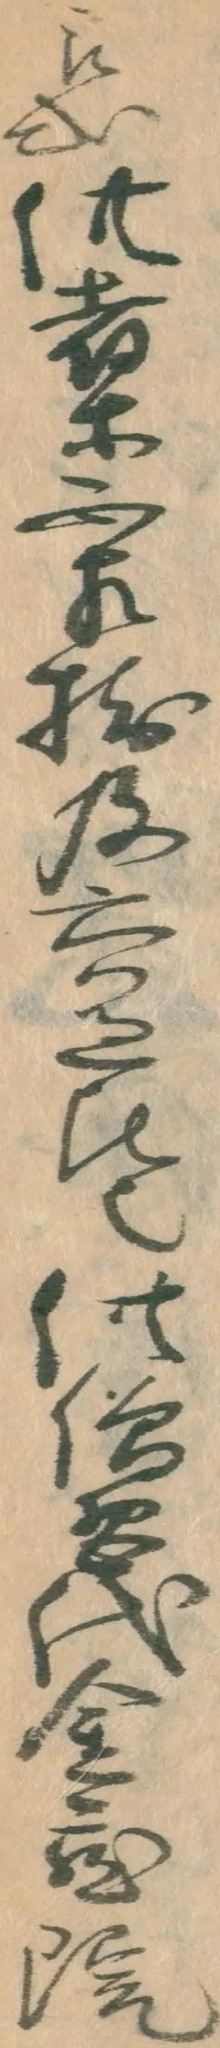被出供者等不相揃及六ツ過比也供僧惣代金蔵院

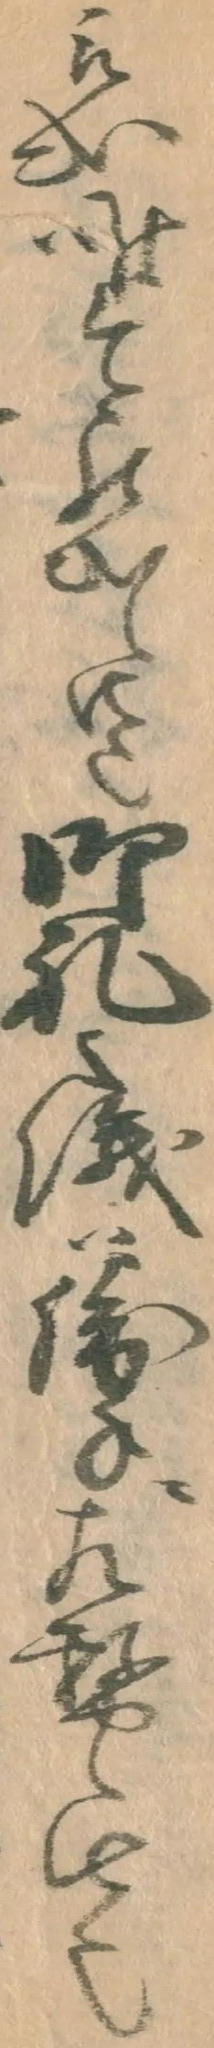被出唯今罷出候由也御礼之儀ハ勝手ニ相務之由也
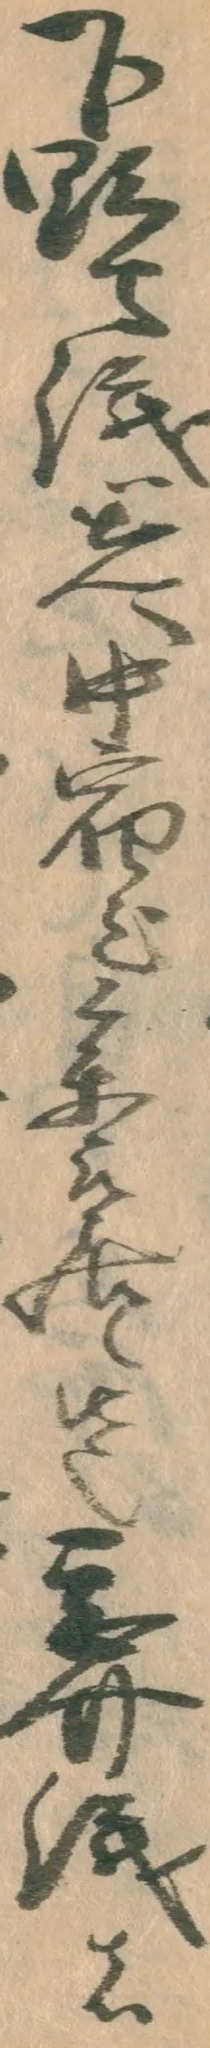下野守儀ハ先へ中宿迄参被居候由也甚介儀者
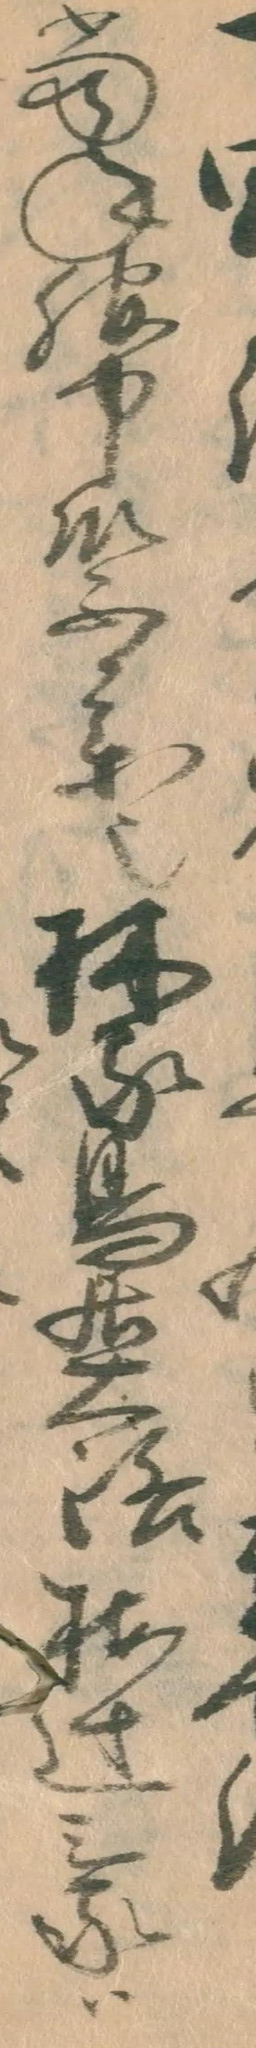当年服中故不参也林家鳥居大路梅辻三家ハ
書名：賀茂社記録. 第60冊
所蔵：国立国会図書館 National Diet Library, JAPAN
